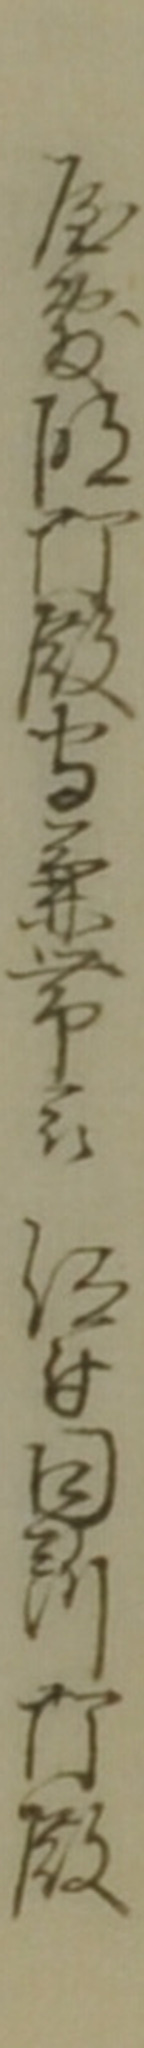屋敷明御殿守兼帯被仰付同所御殿
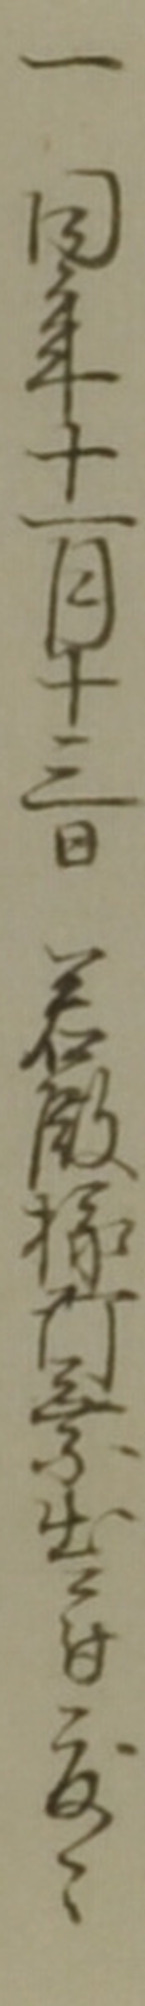一同年十一月十三日若殿様御乗出ニ付度々
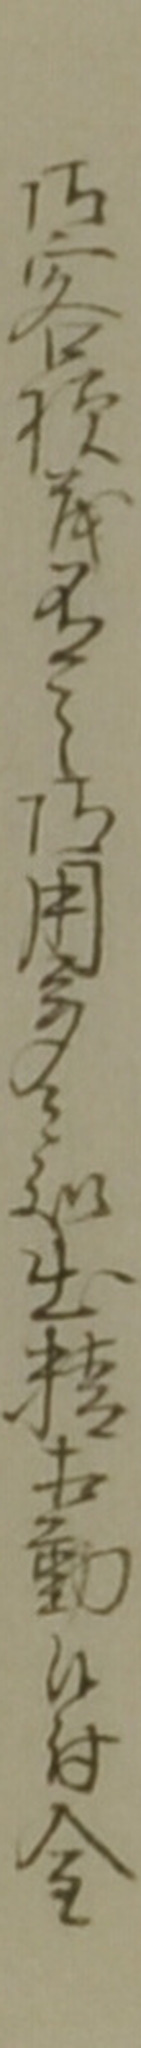御客様茂有之御用多之処出精相勤候付金
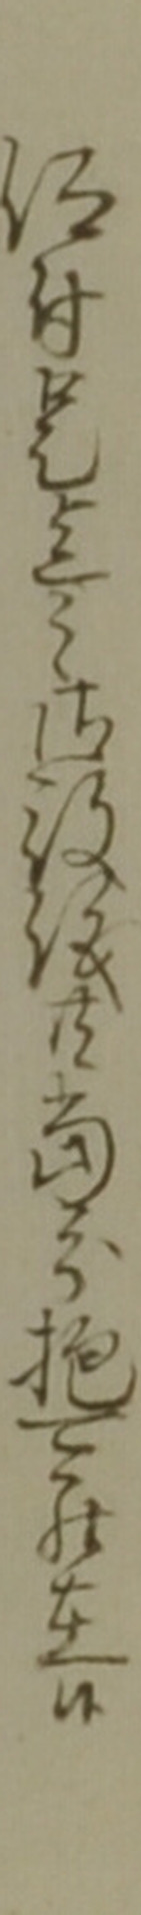仰付是迄之御役儀共当分抱可罷在候
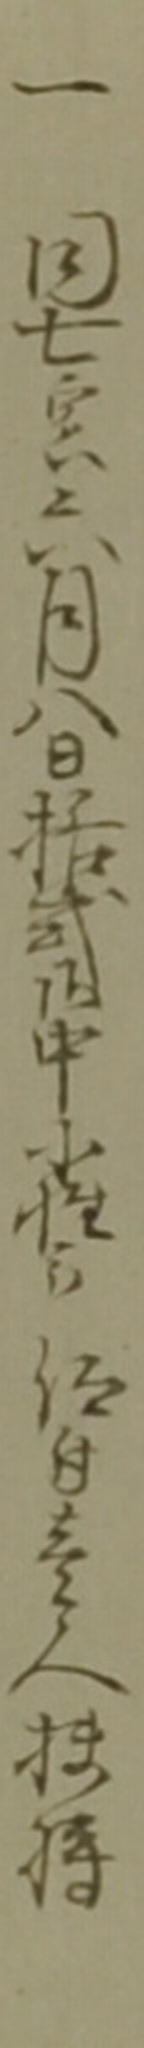一同七寅六月八日格式御中小性被仰付壱二人扶持
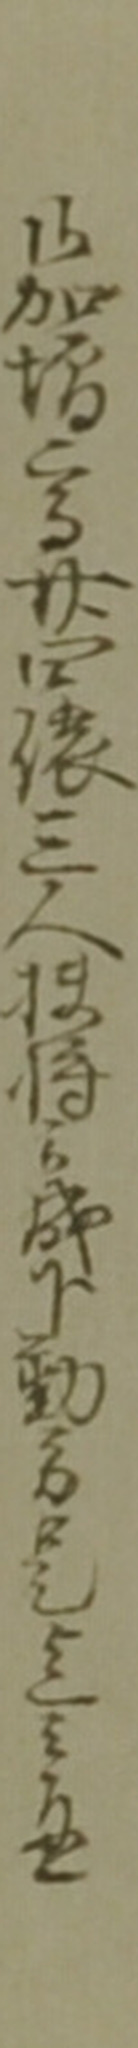御加増高廿四俵三人扶持被成下勤方是迄之通

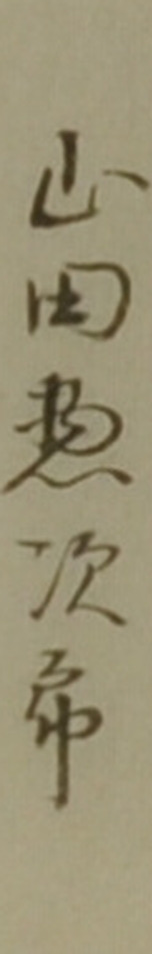山田惣次郎

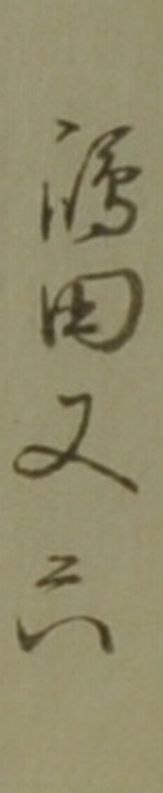嶋田又六
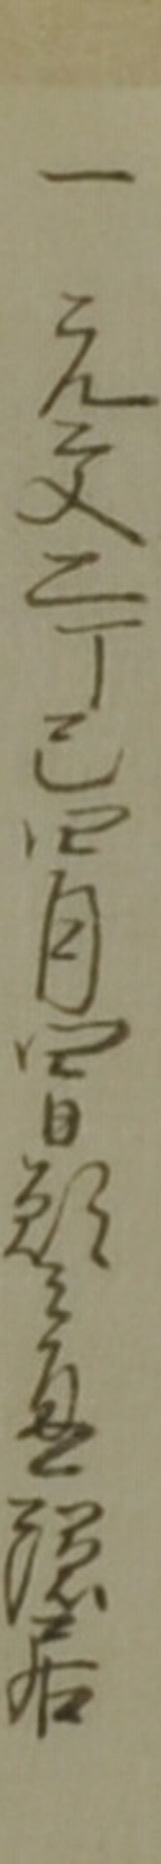一元文二丁巳四月四日願之通隠居」
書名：無足廃家（壱）
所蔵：伊那市立高遠町図書館・合同会社AMANE
